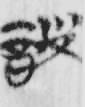○（察）
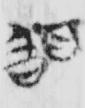○（聞）
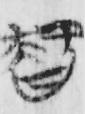智（知）
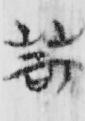苛
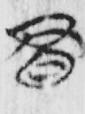冒
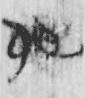卯
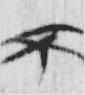不
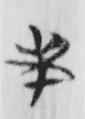未
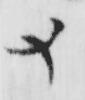又（有）
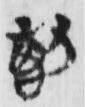斷
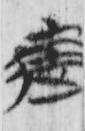○（解）
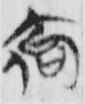○（拘）
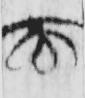而
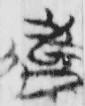逃
